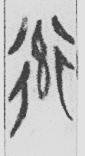率
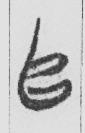𠂤
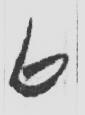㠯（以）
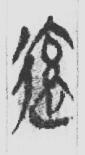{辶交}
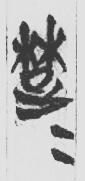楚=
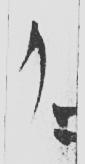人=
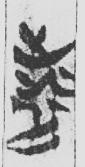涉
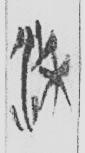{水禾}
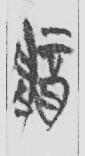𨟻
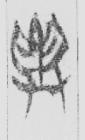與
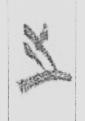之
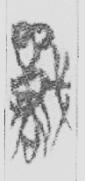戰
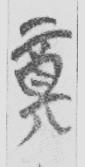奠
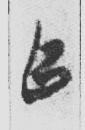𠂤
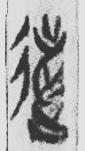逃
